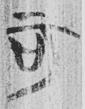可（何）
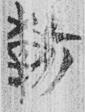新（親）
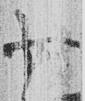才（哉）
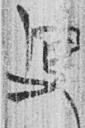○（沒）
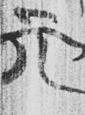亓
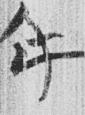身
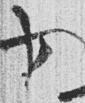才（哉）
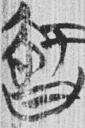○（知）
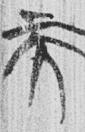天
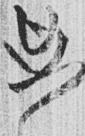足
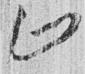㠯（以）
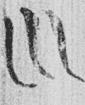川（順）
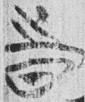○（時）
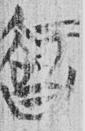○（知）
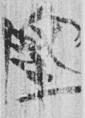地
